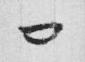厶（私）
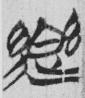○（樂）
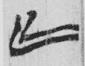亡（無）
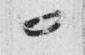厶（私）
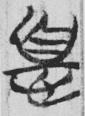○（憂）
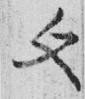父
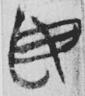母（母）
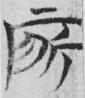所
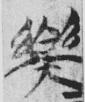樂樂
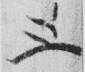之
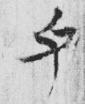父
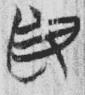母（母）
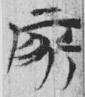所
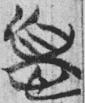憂憂
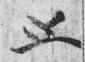之
